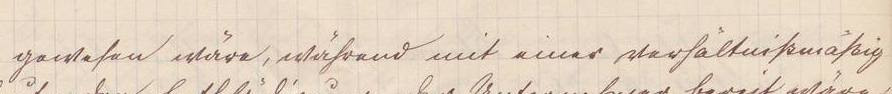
gewesen wäre, während mit einer verhältnißmäßig
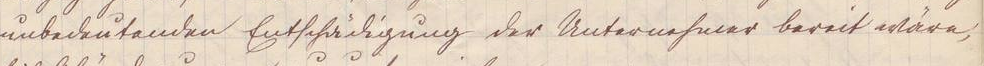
unbedeutenden Entschädigung der Unternehmer bereit wäre,
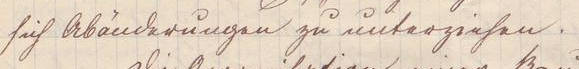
sich Abänderungen zu unterziehen.
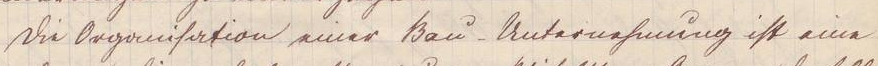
Die Organisation einer Bau-Unternehmung ist eine
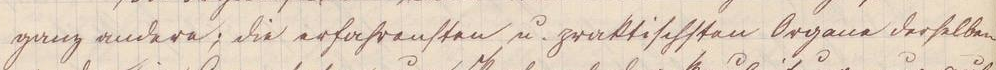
ganz andere; die erfahrensten u. praktischsten Organe derselben
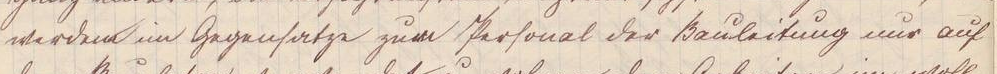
werden im Gegensatze zum Personal der Bauleitung nur auf
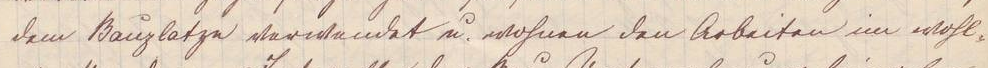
dem Bauplatze verwendet u. wohnen den Arbeiten im wohl-
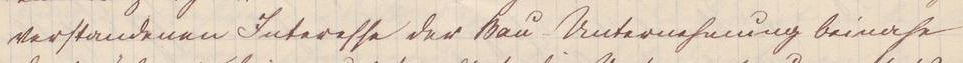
verstandenen Interesse der Bau-Unternehmung beinahe
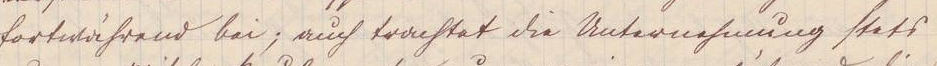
fortwährend bei; auch trachtet die Unternehmung stets
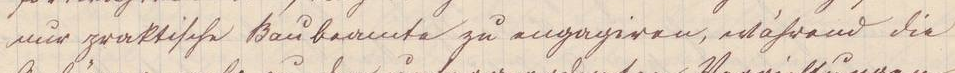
nur praktische Baubeamte zu engagiren, während die
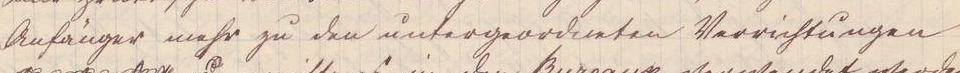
Anfänger mehr zu den untergeordneten Verrichtungen
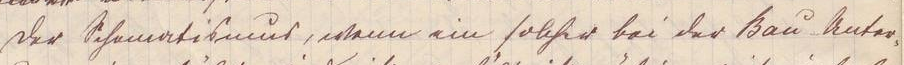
Der Schematismus, wenn ein solcher bei der Bau-Unter-
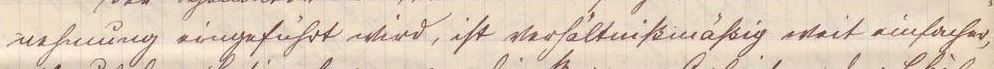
nehmung eingeführt wird, ist verhältnißmäßig weit einfacher
